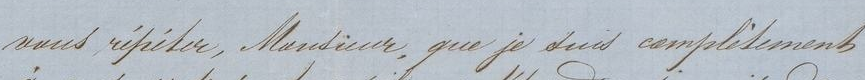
vous répéter, Monsieur, que je suis complètement
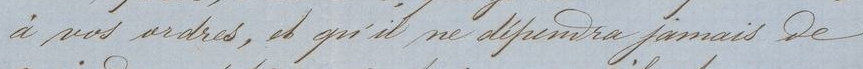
à vos ordres, et qu'il ne dépendra jamais de
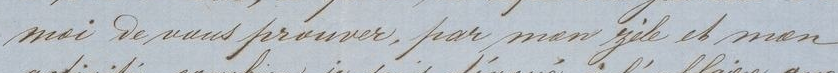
moi de vous prouver, par mon zèle et mon
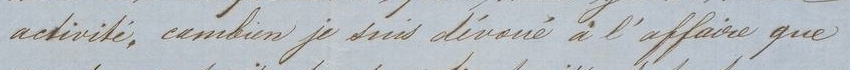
activité, combien je suis dévoué à l'affaire que
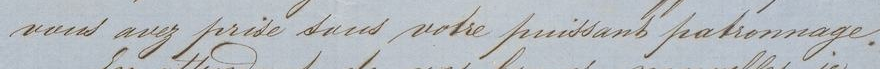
vous avez prise sous votre puissant patronnage.
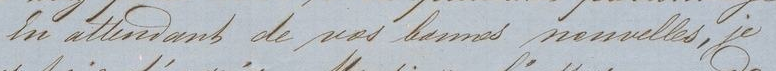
En attendant de vos bonnes nouvelles, je
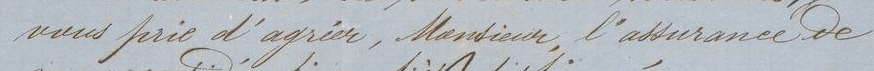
vous prie d'agréer, Monsieur, l'assurance de
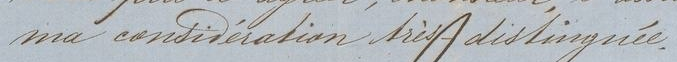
ma considération très-distinguée.
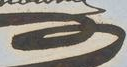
Baranowski
